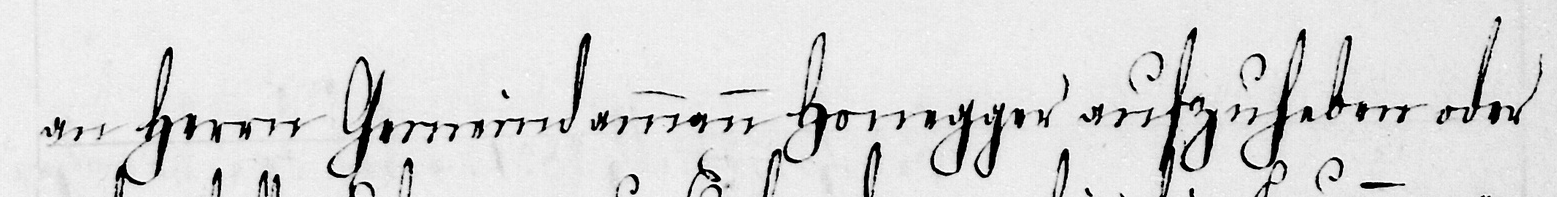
an Herrn Gemeindammann Honegger aufzuheben oder
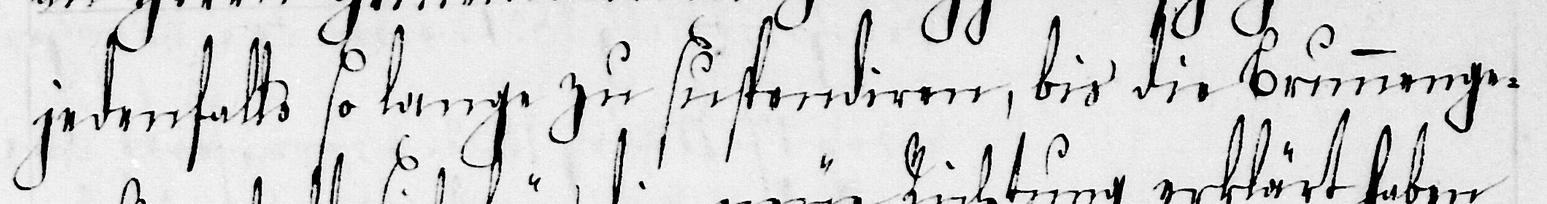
jedenfalls so lange zu suspendiren, bis die Brunnenge¬
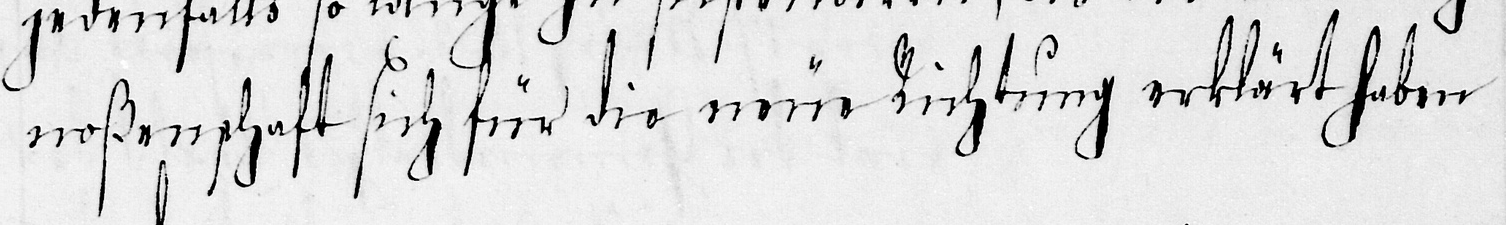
noßenschaft sich für die neue Richtung erklärt haben
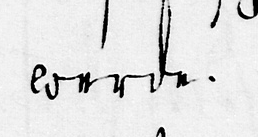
werde.
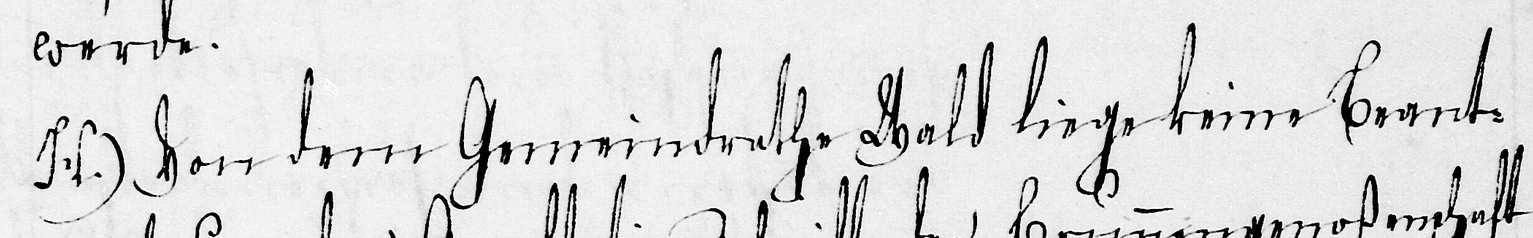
H.) Von dem Gemeindrathe Wald liege keine Beant¬
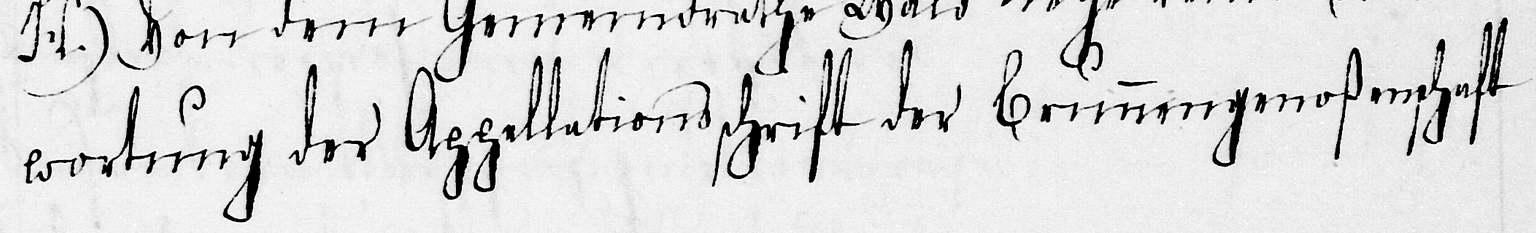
wortung der Appellationsschrift der Brunnengenoßenschaft
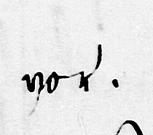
vor.
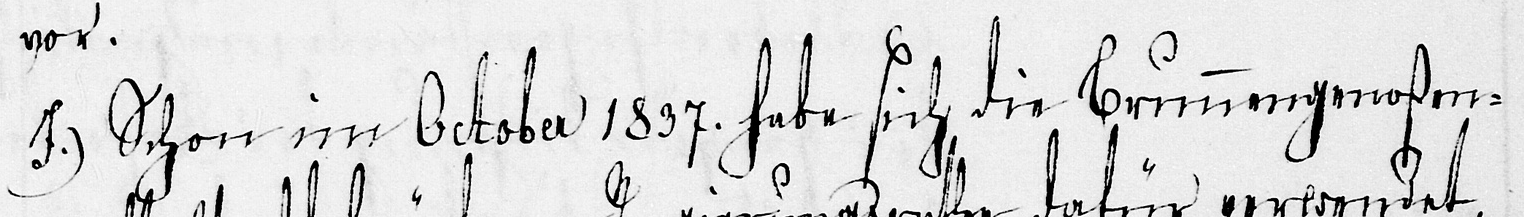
I.) Schon im October 1837. habe sich die Brunnengenoßen¬
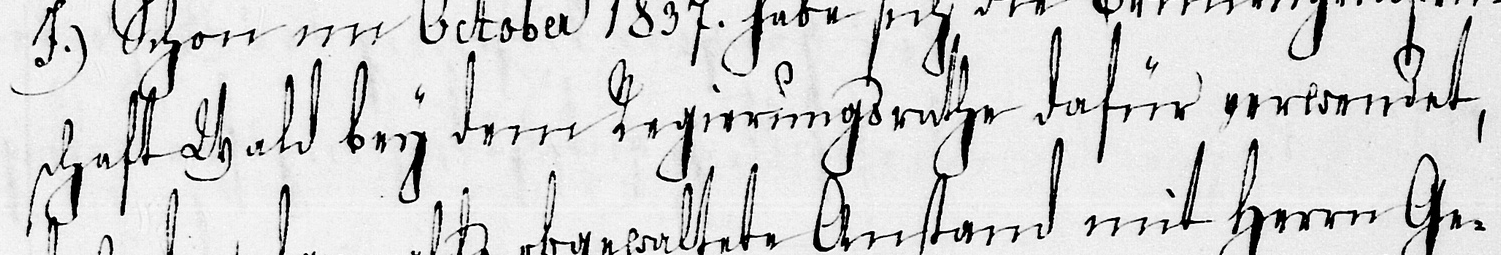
schaft Wald bey dem Regierungsrathe dafür verwendet,
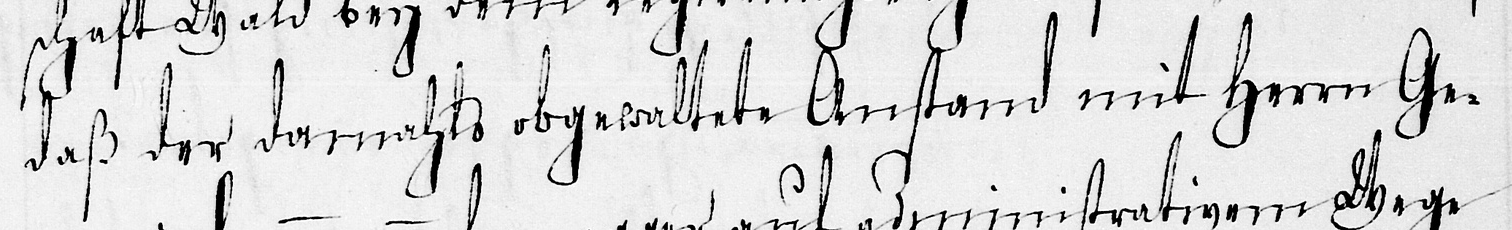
daß der damahls abgewaltete Anstand mit Herrn Ge¬
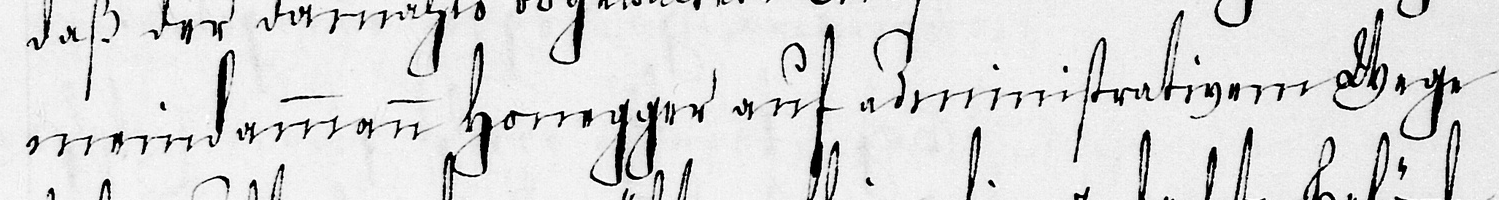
meindammann Honegger auf administrativem Wege
